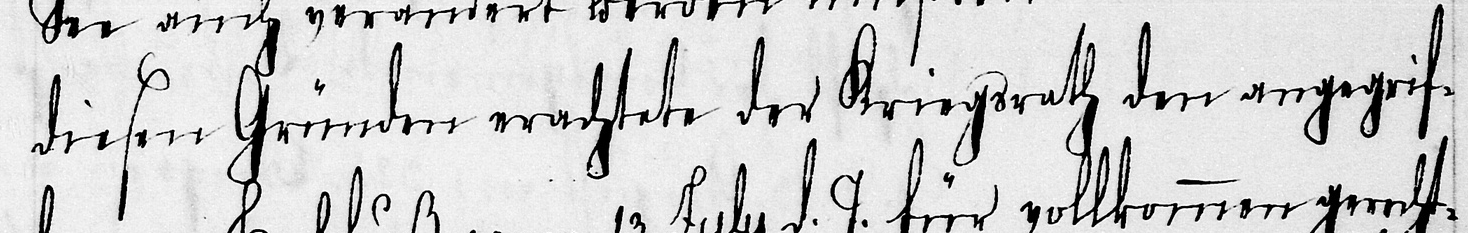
diesen Gründen erachtete der Kriegsrath den angegrif¬
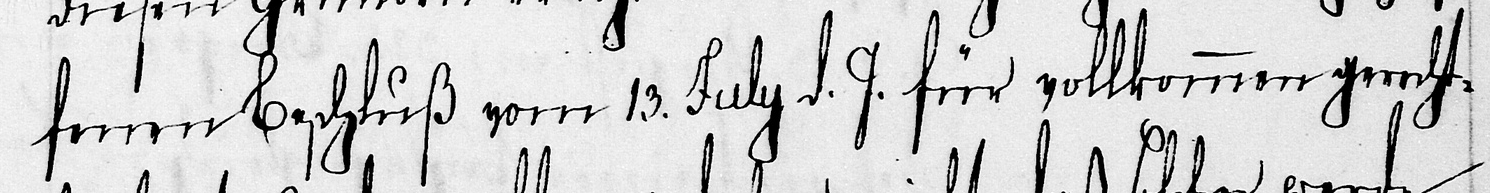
fenen Beschluß vom 13. July d. J. für vollkommen gerecht¬
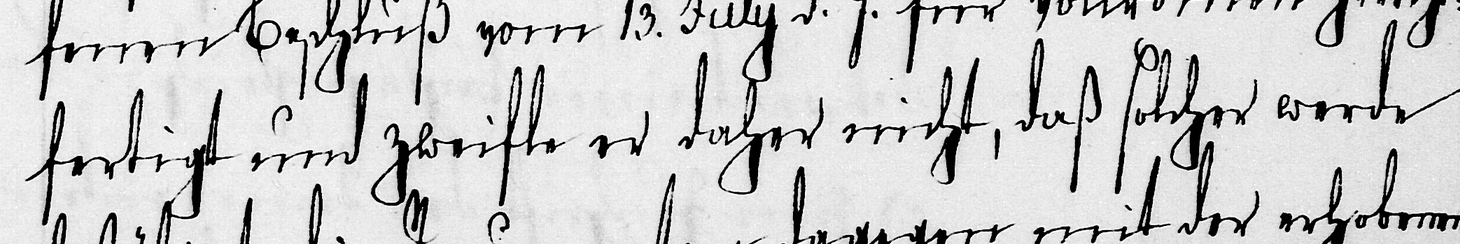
fertigt und zweifle er daher nicht, daß solcher werde
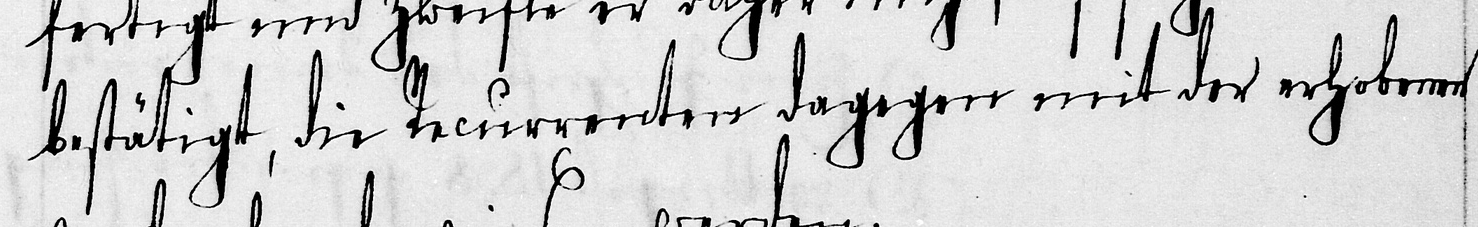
bestätigt, die Recurrenten dagegen mit der erhobenen
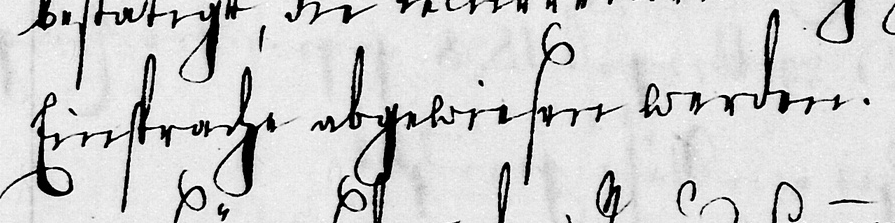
Einsprache abgewiesen werden.
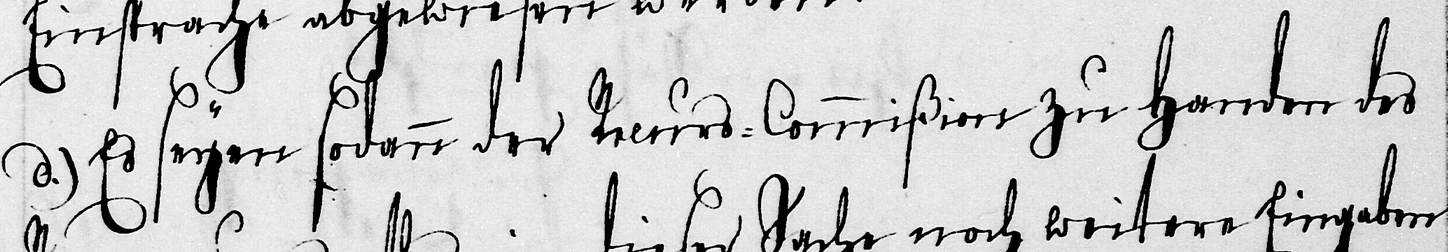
d.) Es seyen sodann der Recurs-Commißion zu Handen des
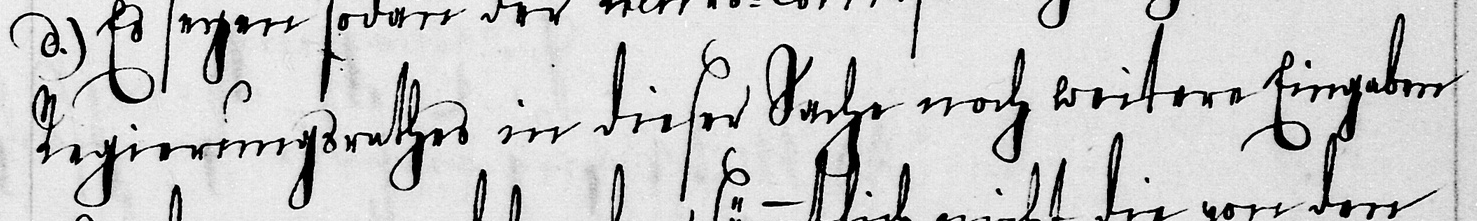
Regierungsrathes in dieser Sache noch weitere Eingaben
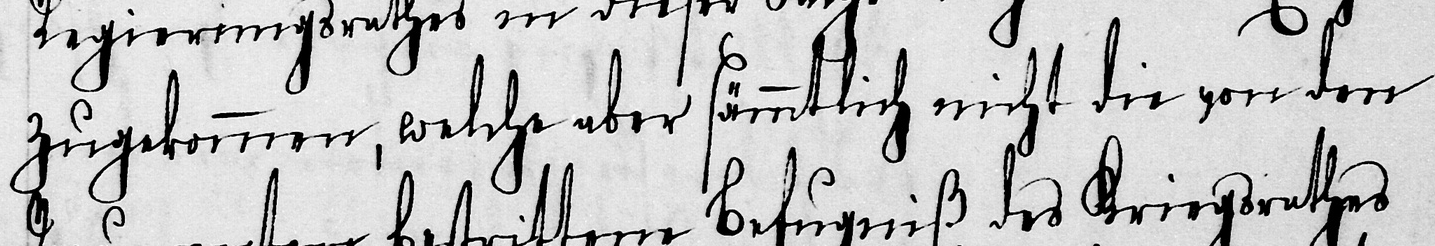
zugekommen, welche aber sämmtlich nicht die von den
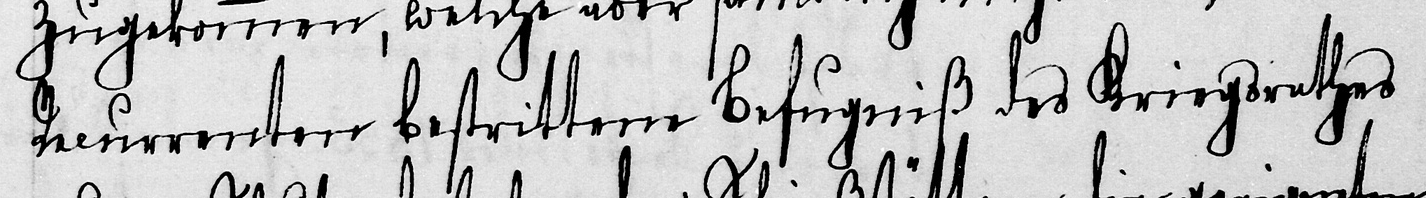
Recurrenten bestrittene Befugniß des Kriegsrathes
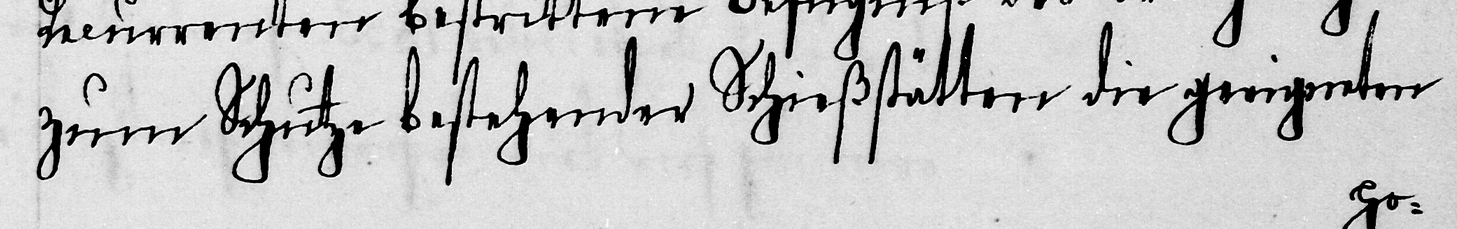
zum Schutze bestehender Schießstätten die geeigneten
